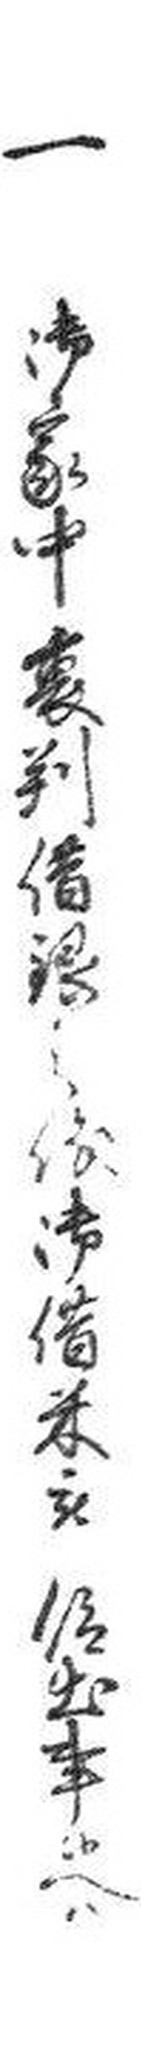一御家中裏判借銀之儀御借米被仰出事候ヘハ
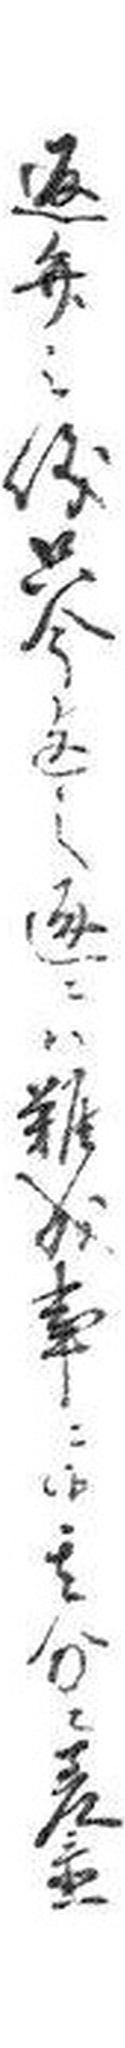返弁之儀只今迄之通ニハ難成事ニ候其分ニ差置
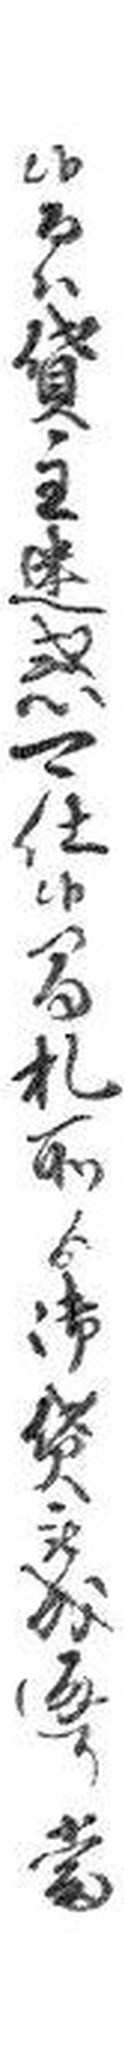候而ハ貸主迷惑可仕候間札所ゟ御貸被成通り当
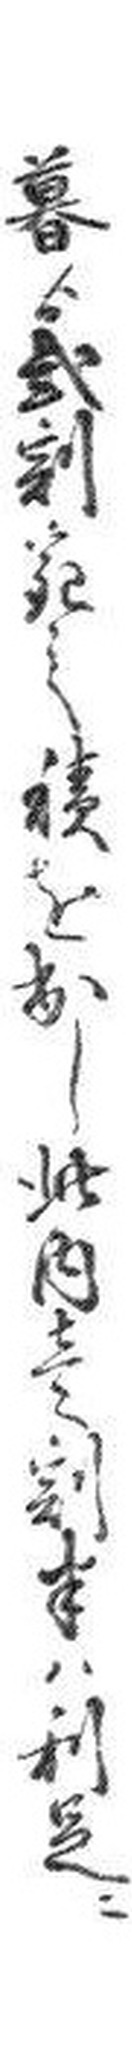暮ゟ弐割宛之積を出し此内壱割半ハ利足ニ
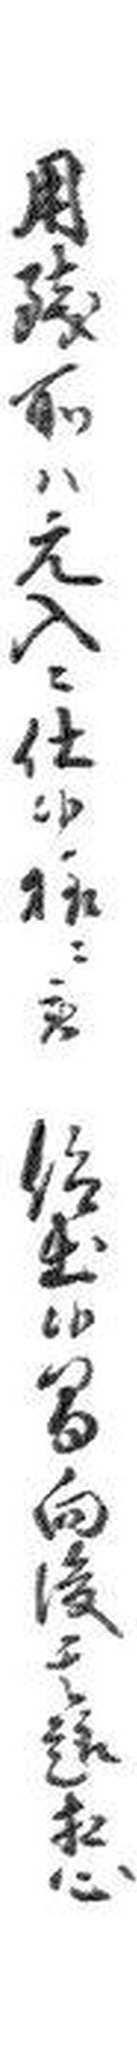用残所ハ元入ニ仕候様ニ被仰出候間向後其趣相心
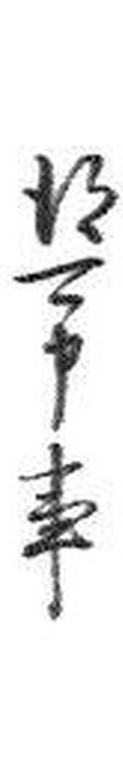得可申事
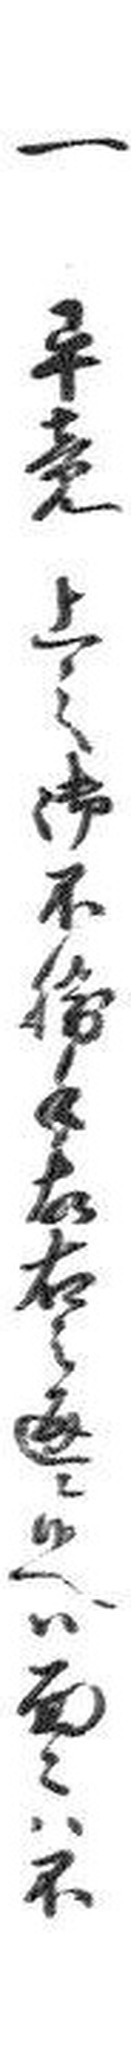一畢竟上之御不勝手故右之通ニ候ヘハ面々ハ不
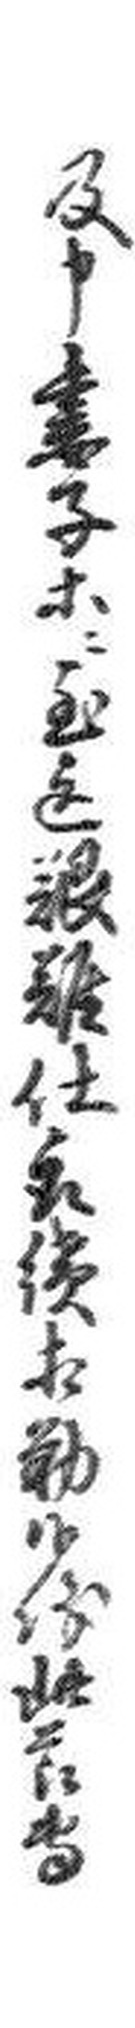及申妻子等ニ至迄艱難仕取続相勤候儀此節専
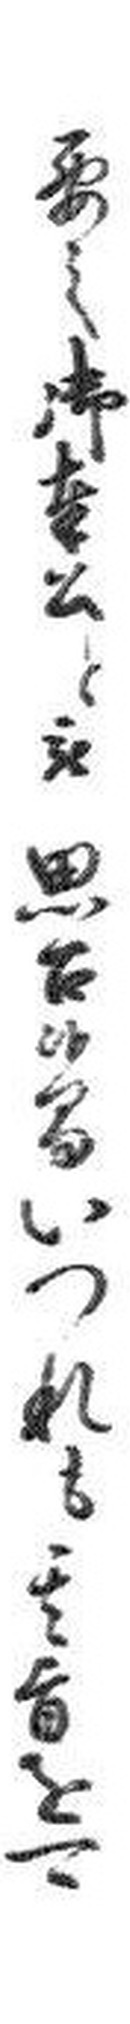要之御奉公と被思召候間いつれも其旨を可
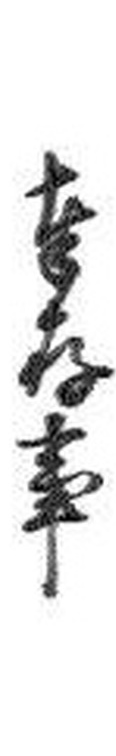奉存事
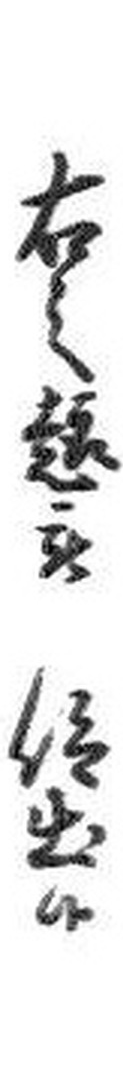右之趣被仰出候
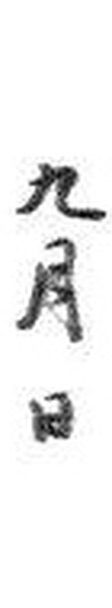九月日
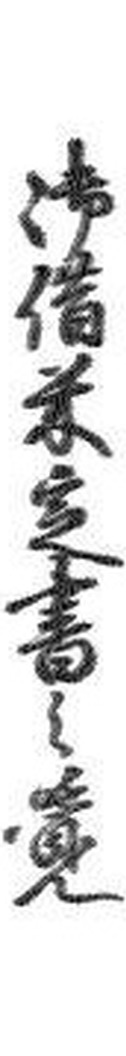御借米定書之覚

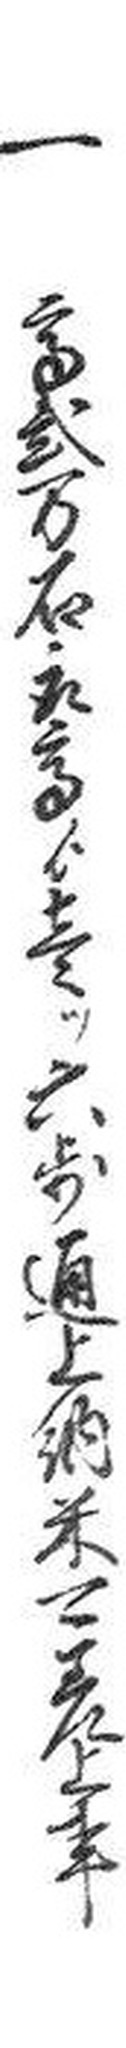一高弐万石取高ゟ壱ツ六歩通上納米可差上事
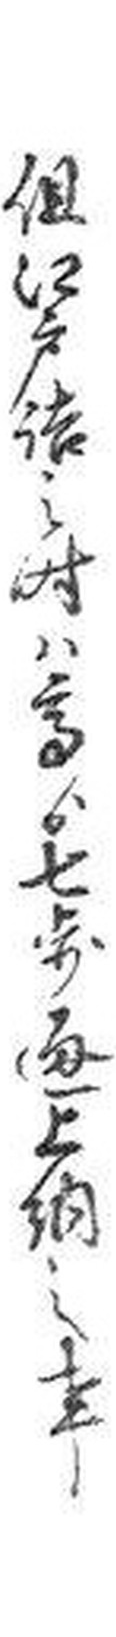但江戸詰之時ハ高ゟ七歩通上納之事
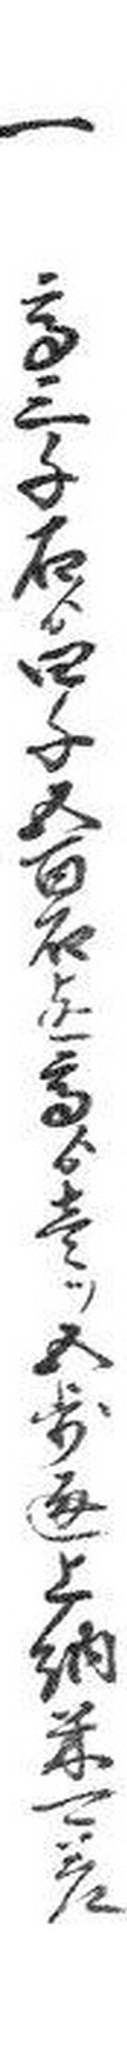一高三千石ゟ四千五百石迄高ゟ壱ツ五歩通上納米可差
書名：家譜 二十三 吉品公 従宝永元年到同二年
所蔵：福井県文書館 Fukui Prefectural Archives
